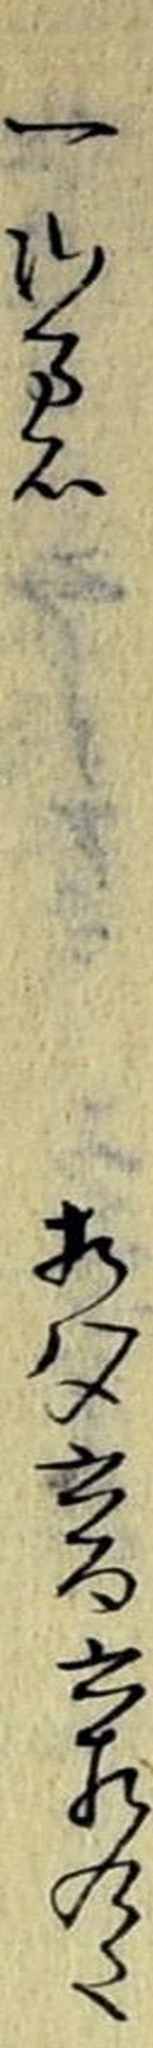一弐万石拾八貫六百六拾九匁
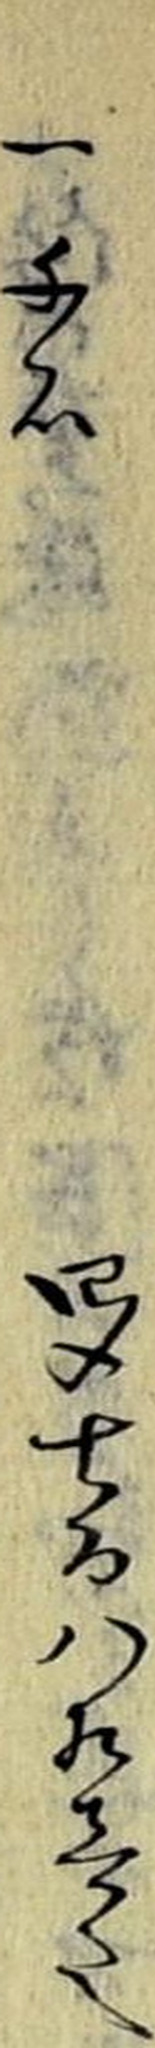一千石四貫七百八拾壱匁
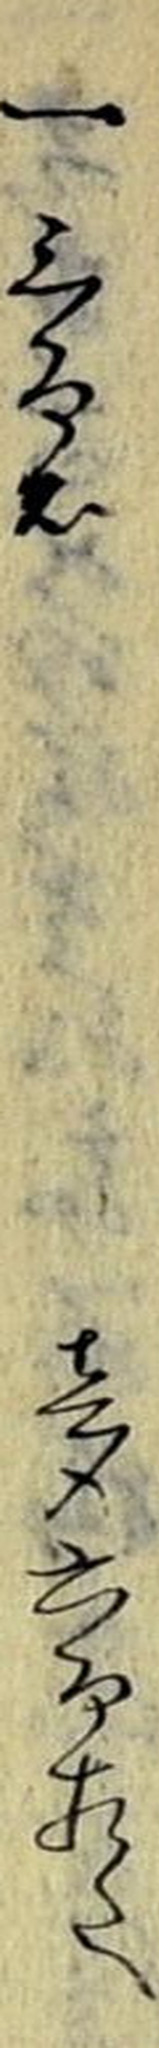一三百石壱貫六百拾匁
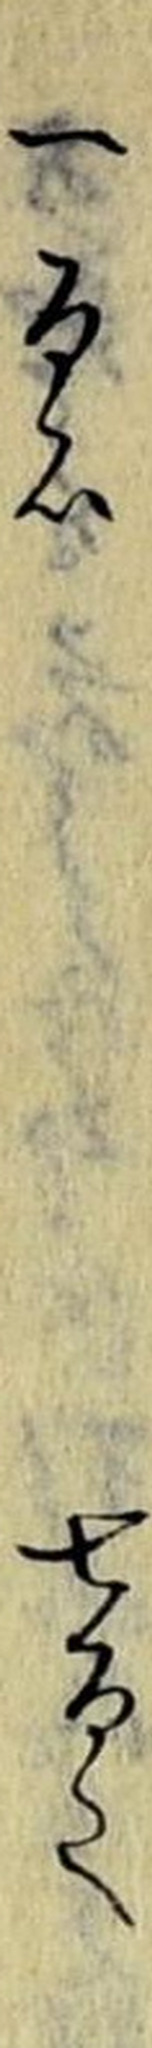一百石七百匁
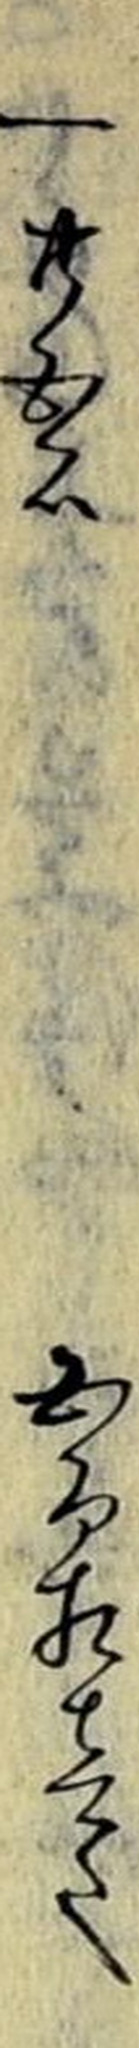一廿五石五百拾壱匁
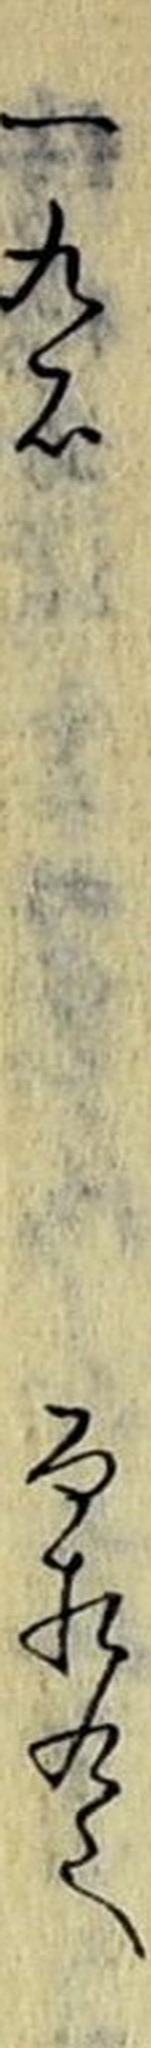一九石百拾九匁
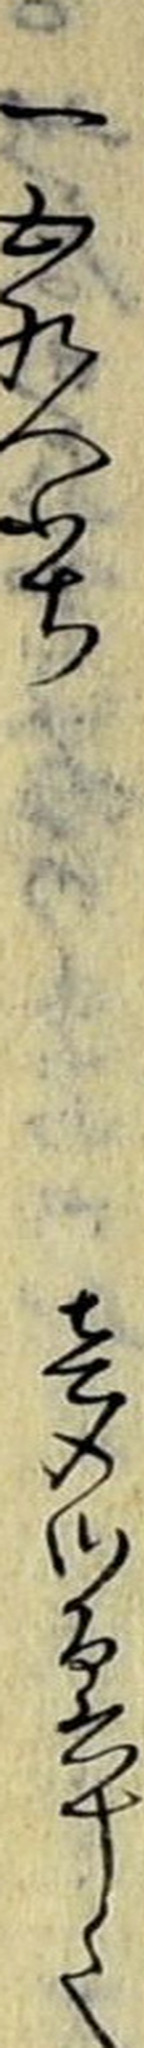一五拾人ふち壱貫弐百六十匁
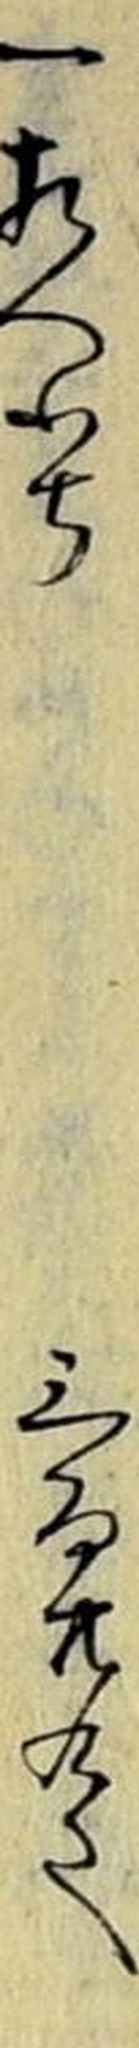一拾人ふち三百廿九匁
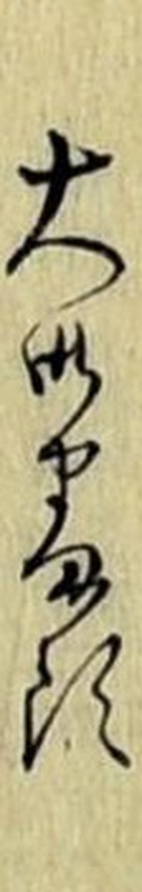大御番頭
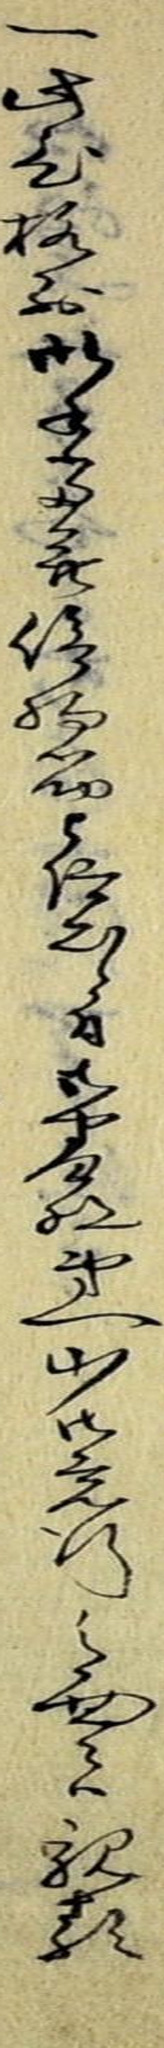一此度格別御手当并倹約筋被仰出候に付御番組第一少御充行候面々は親類
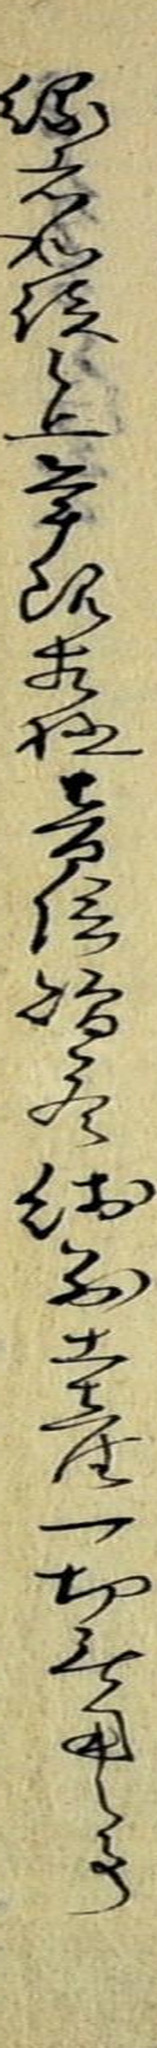縁者和談之上年限相極音信贈答餞別土産一切無用之事
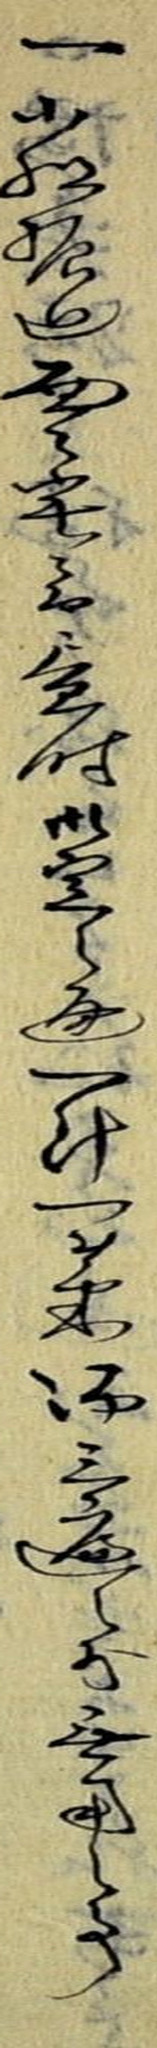一少組振廻面々宅に而昼時御定之通一汁一菜酒三遍之外無用之事
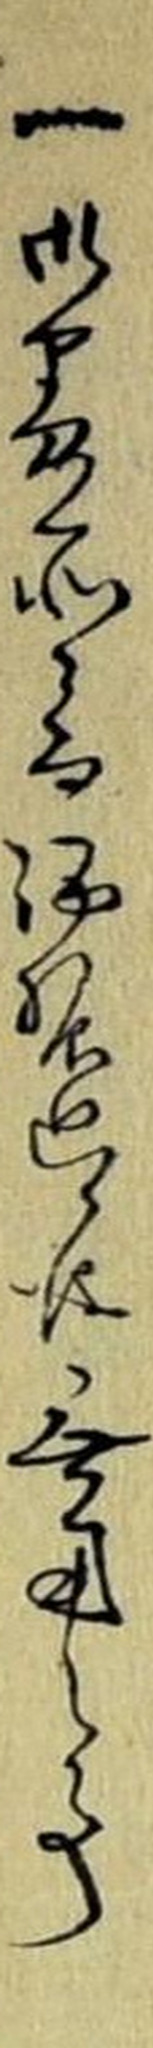一御番所に而酒振廻候儀無用之事
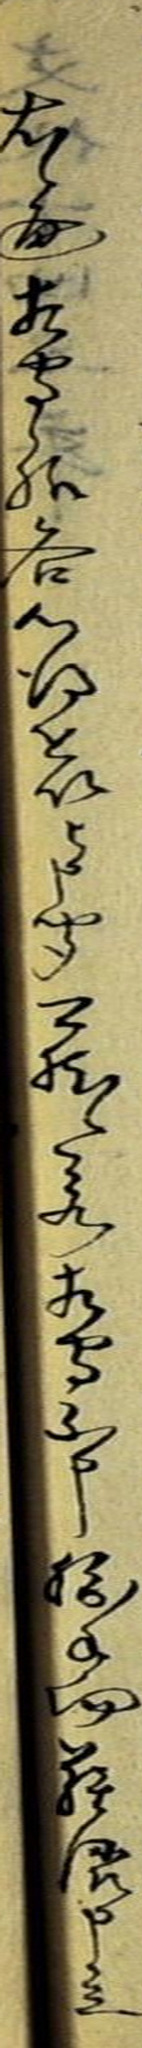右之通相守候様各心得を以被申聞可然候若相守不申勝手向難渋申立
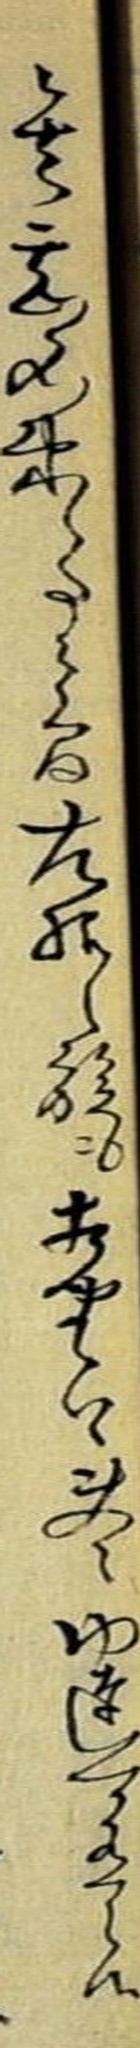之者甚不束之事に候間左様之族も相聞候はヽ夫々内達可有之候
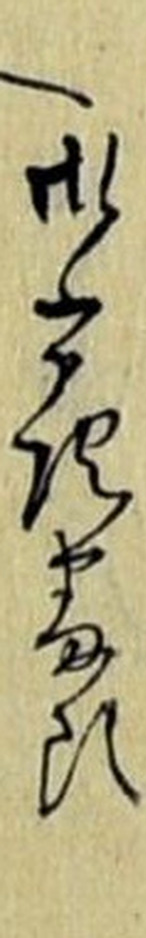御書院番頭
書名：命令之部 四
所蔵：福井県文書館 Fukui Prefectural Archives
